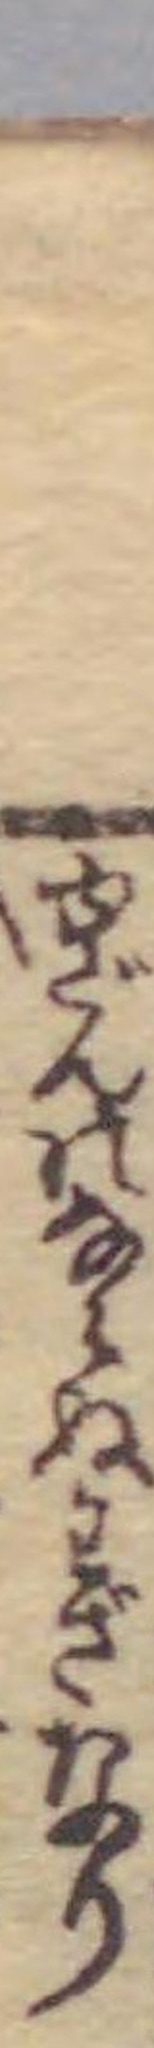ゆだんのならぬわざなり
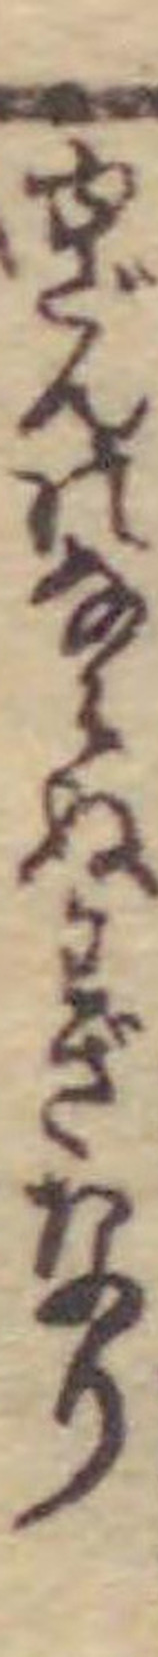ゆだんのならぬわざなり
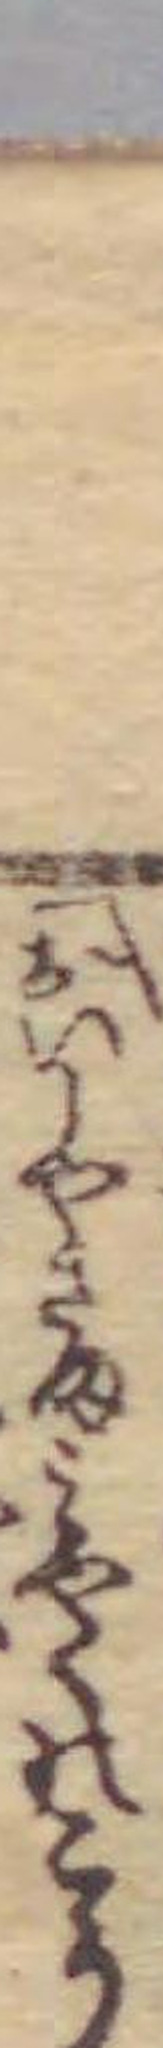〽おいしやさまみやくのこう
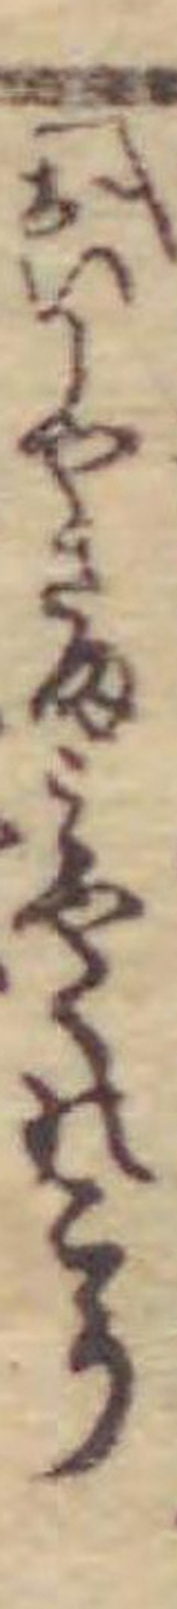〽おいしやさまみやくのこう
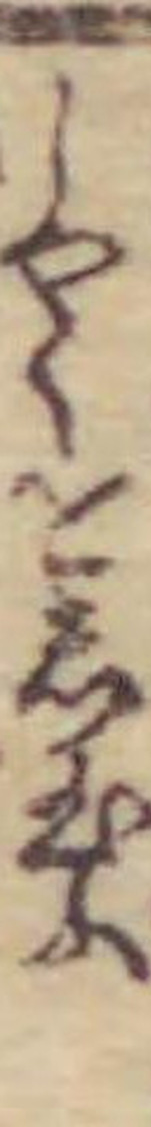しやくをし玉ふ
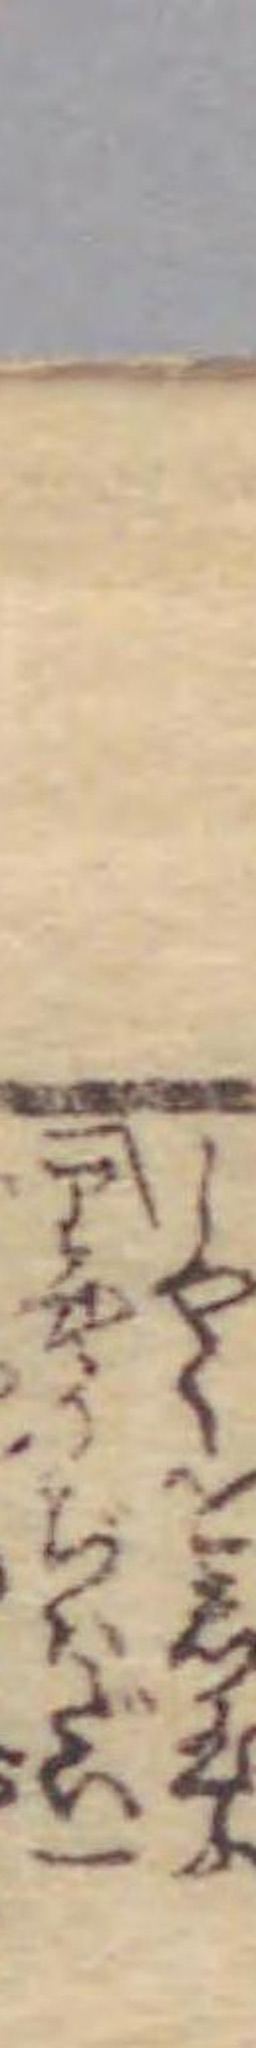〽りやうぢはだい一
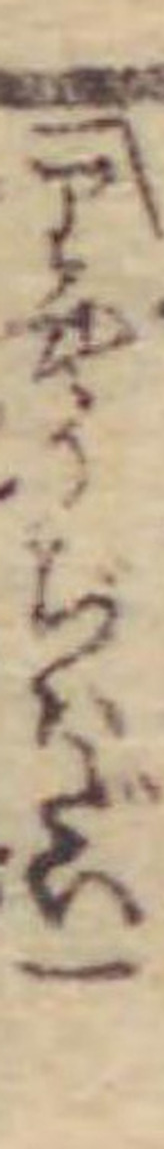〽りやうぢはだい一
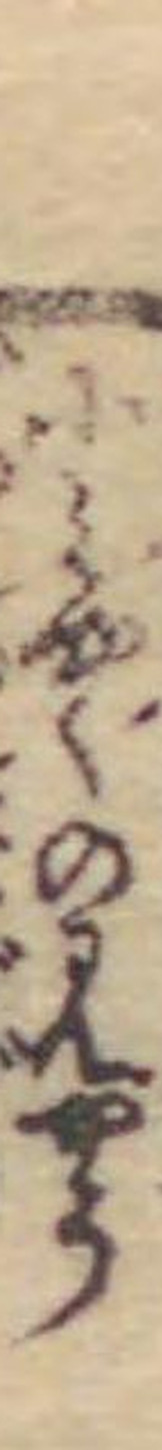にみやくの見やう
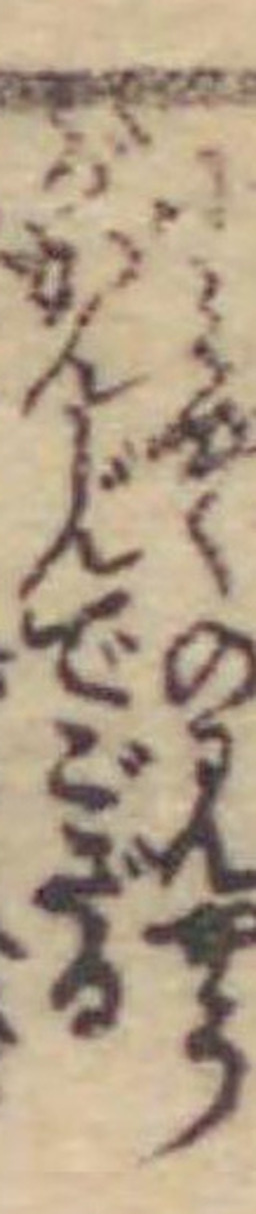がかんじんでござる
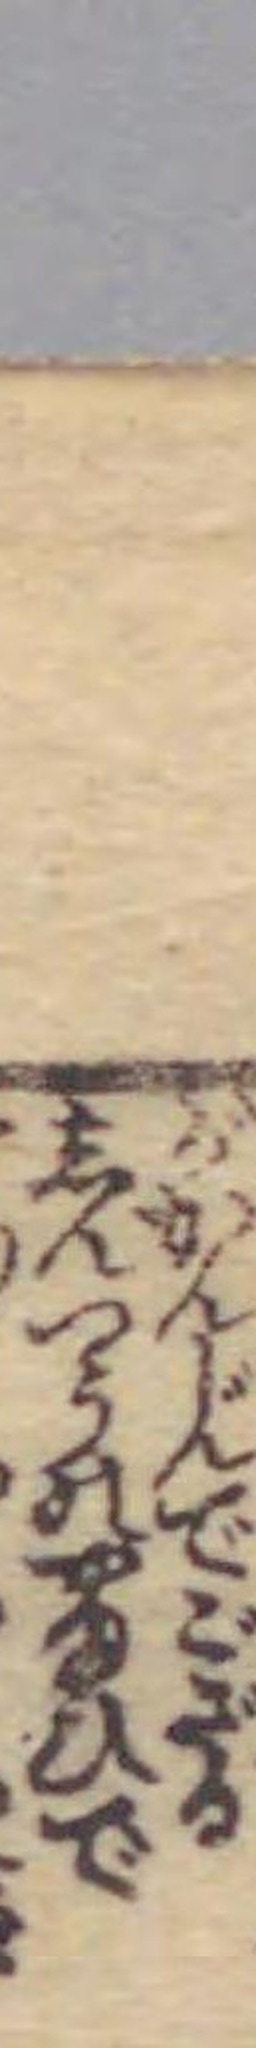しんつうのやまひで
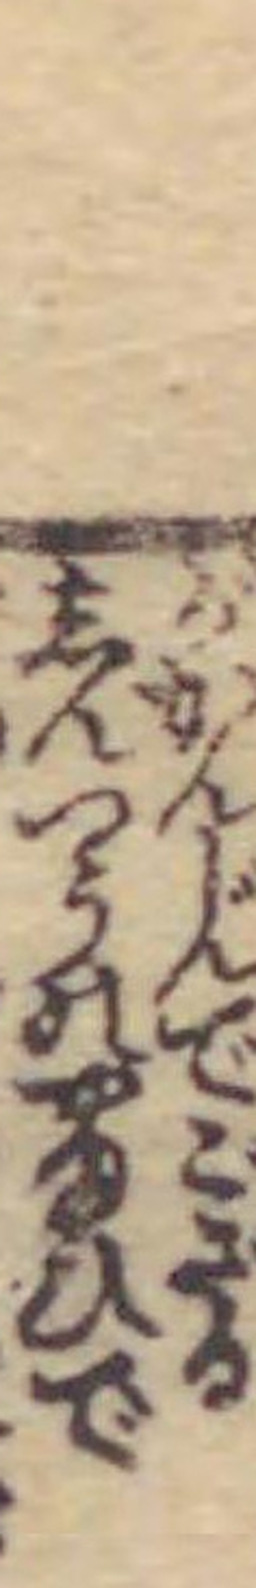しんつうのやまひで
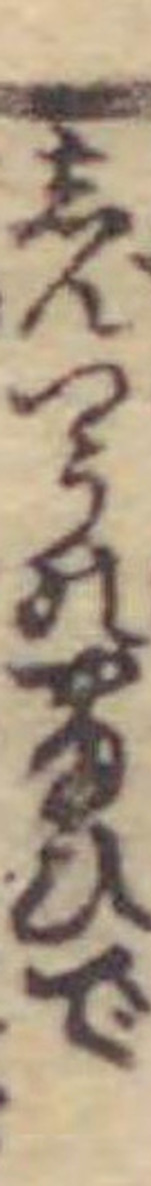しんつうのやまひで
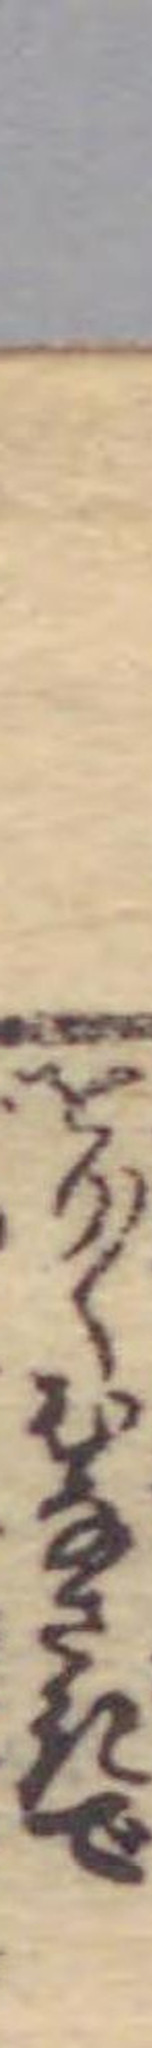をり〳〵むなさきで
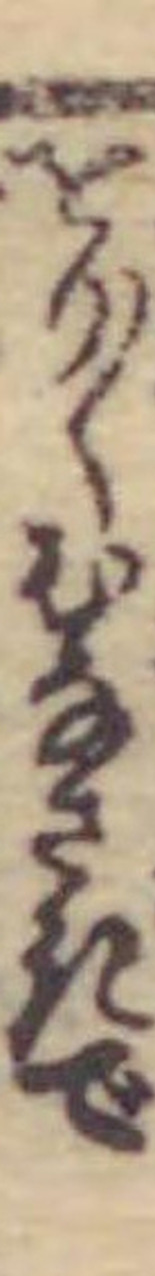をり〳〵むなさきで
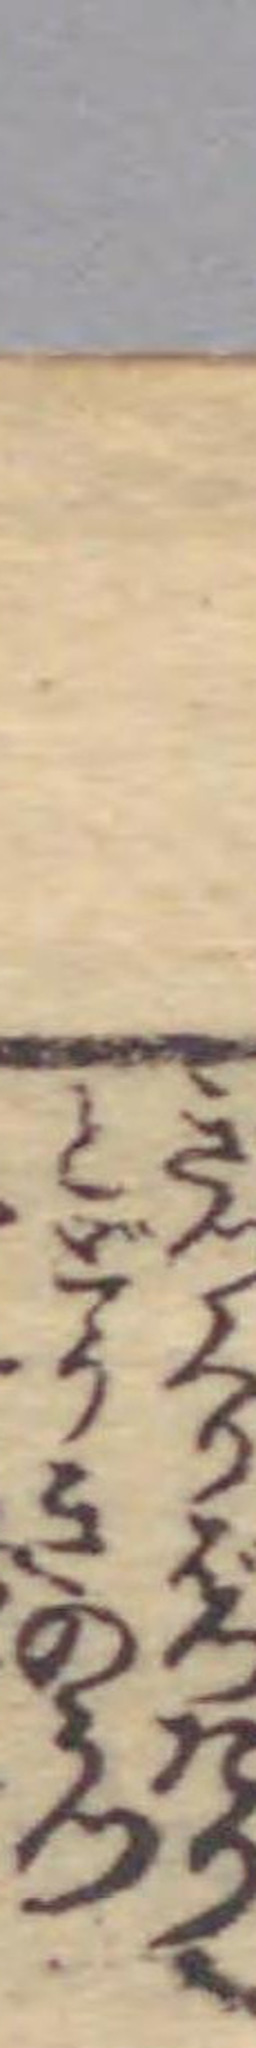とどうきのうつ
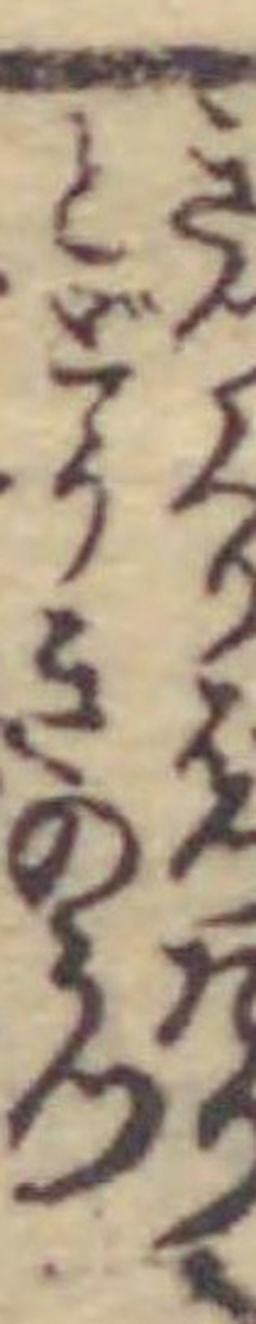とどうきのうつ
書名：御誂染長寿小紋 : 3巻
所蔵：国立国会図書館 National Diet Library, JAPAN
